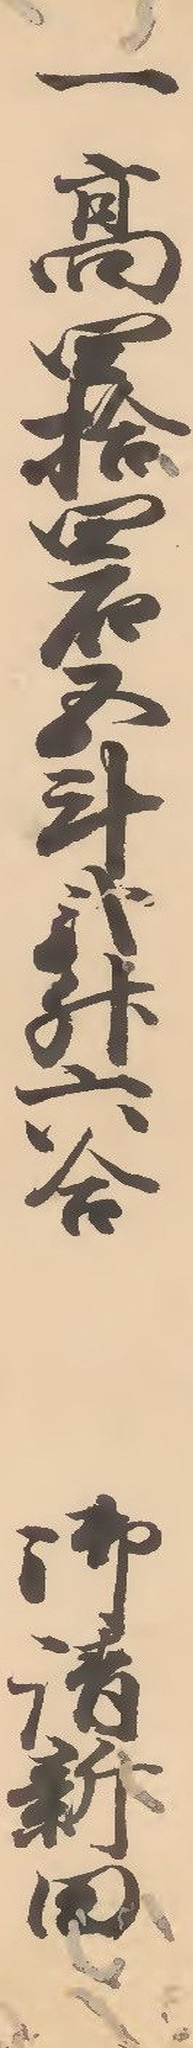一高四拾四石五斗弐升六合御請新田
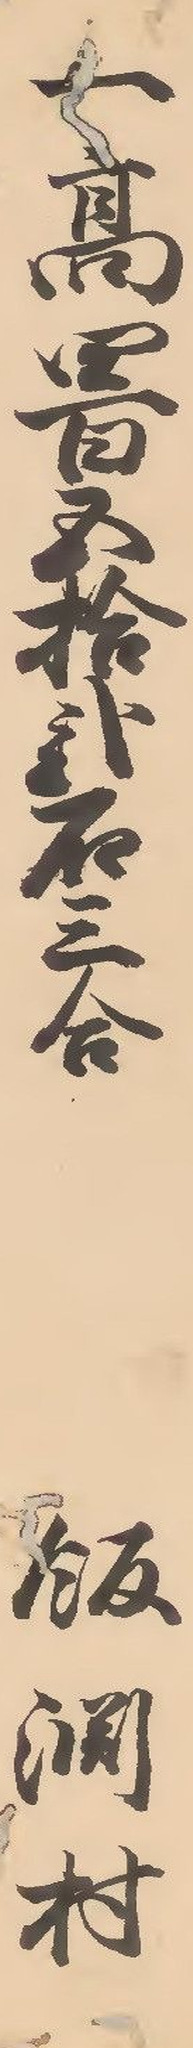一高四百五拾弐石三合飯淵村
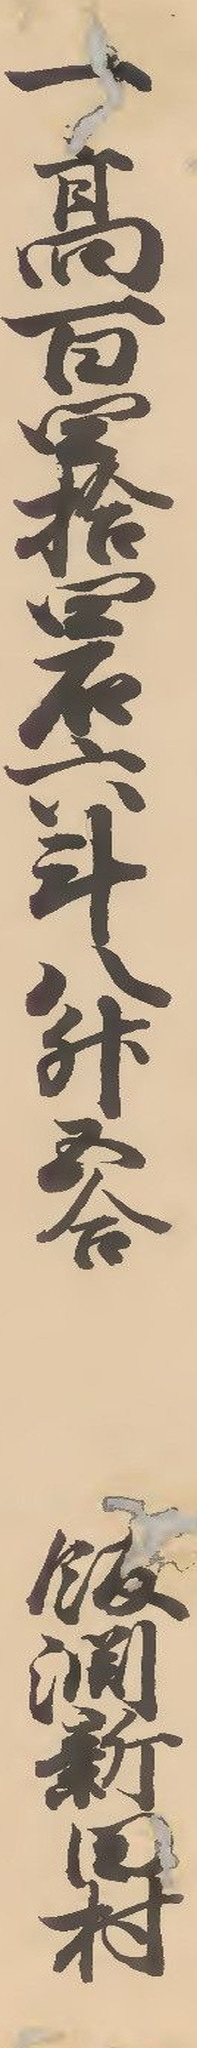一高百四拾四石六斗八升五合飯淵新田村
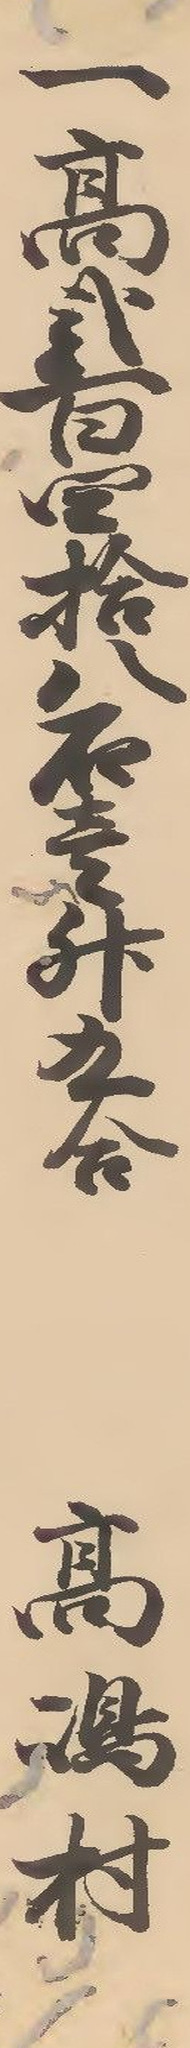一高弐百四拾八石壱升九合高島村
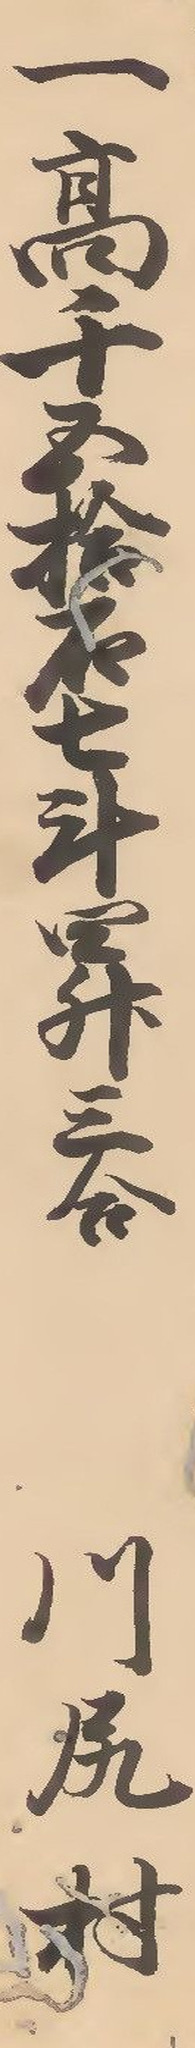一高千五拾石七斗四升三合川尻村
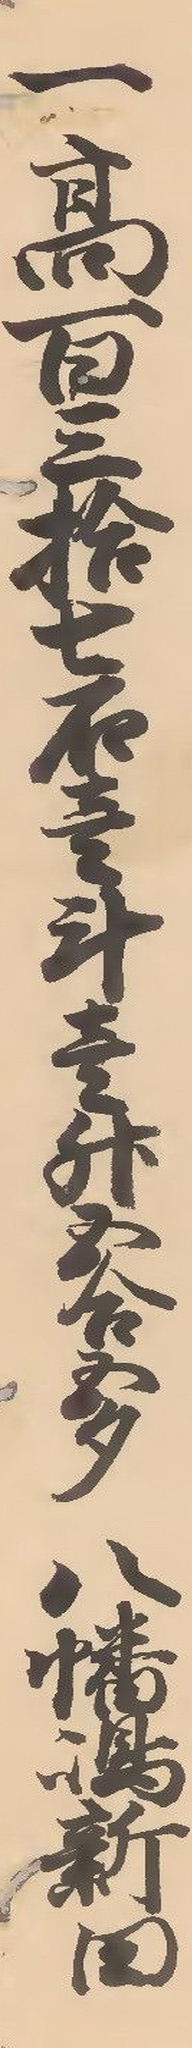一高百三拾七石壱斗壱升五合五尺八幡島新田

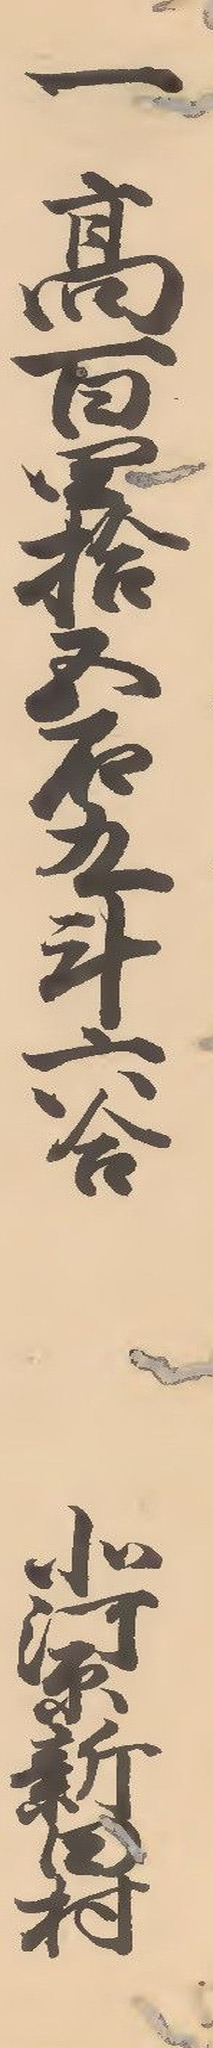一高百四拾五石九斗六合北河原新田村
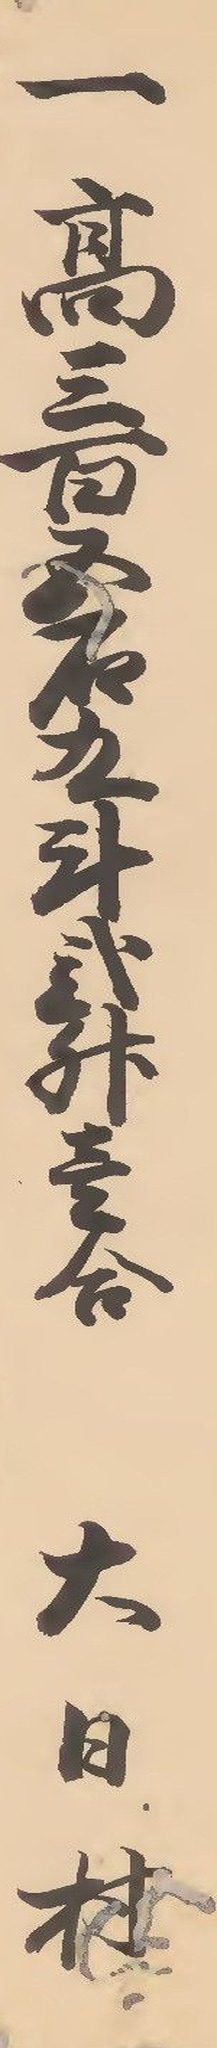一高三百五石九斗弐升壱合大日村
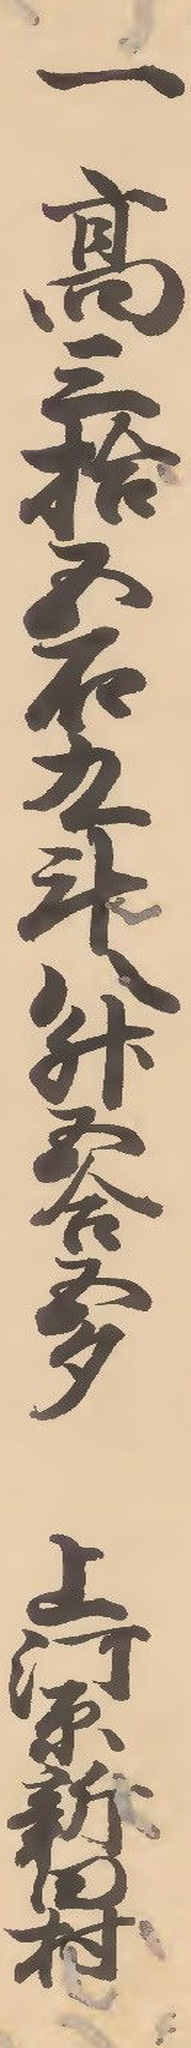一高三拾五石九斗八升五合五勺上河原新田村
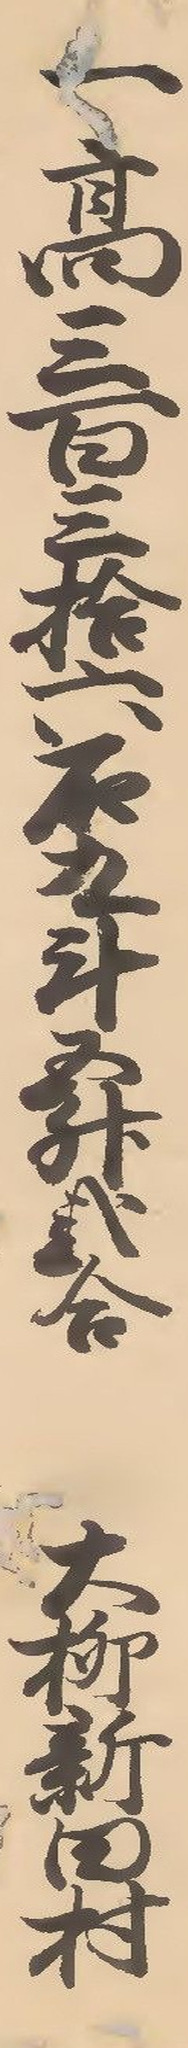一高三百三拾六石九斗五升弐合大柳新田村
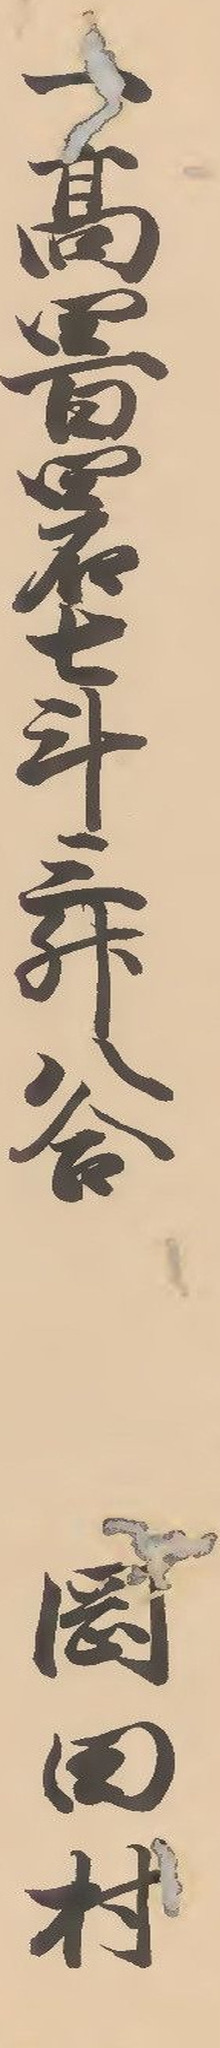一高四百四石七斗三升八合岡田村
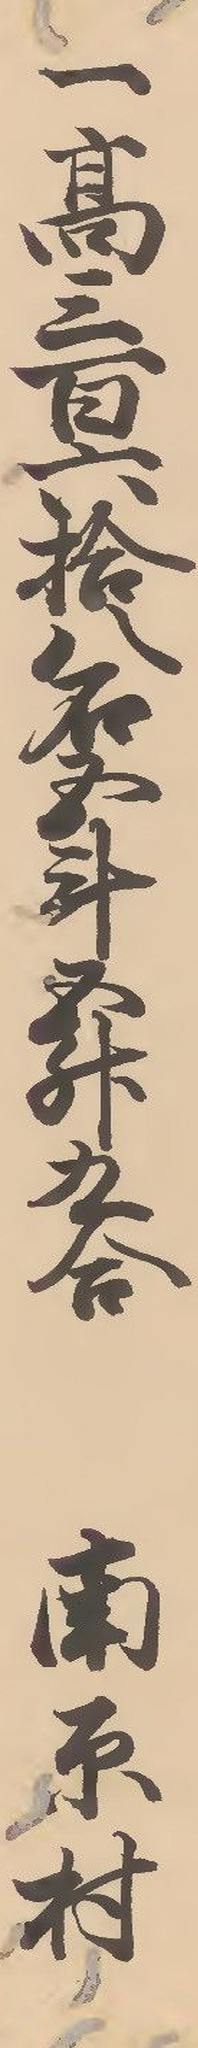一高三百六拾八石五斗五升九合南原村
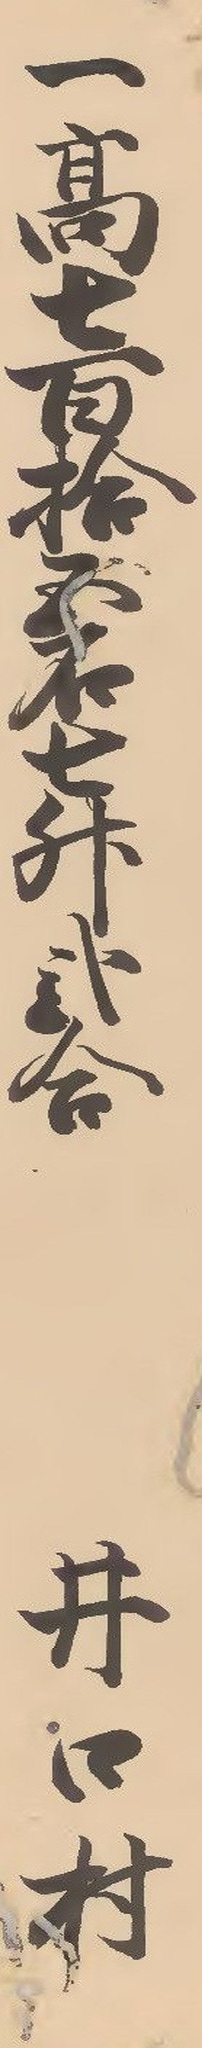一高七百拾五石七升弐合井口村
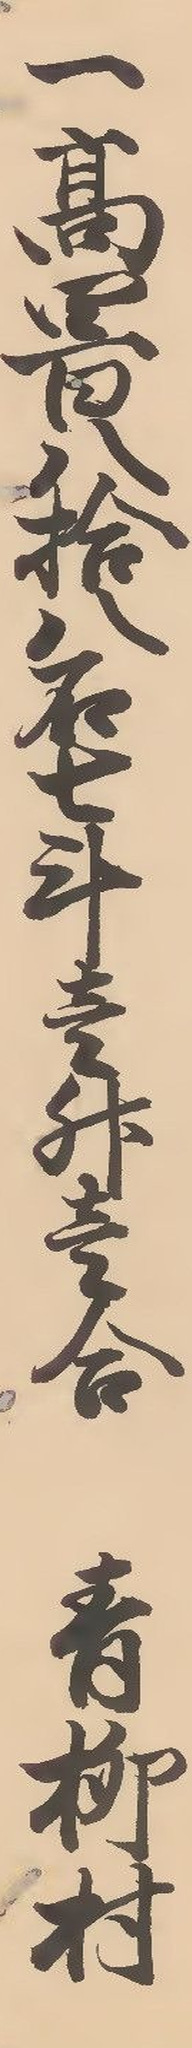一高四百八拾八石七斗壱升壱合青柳村

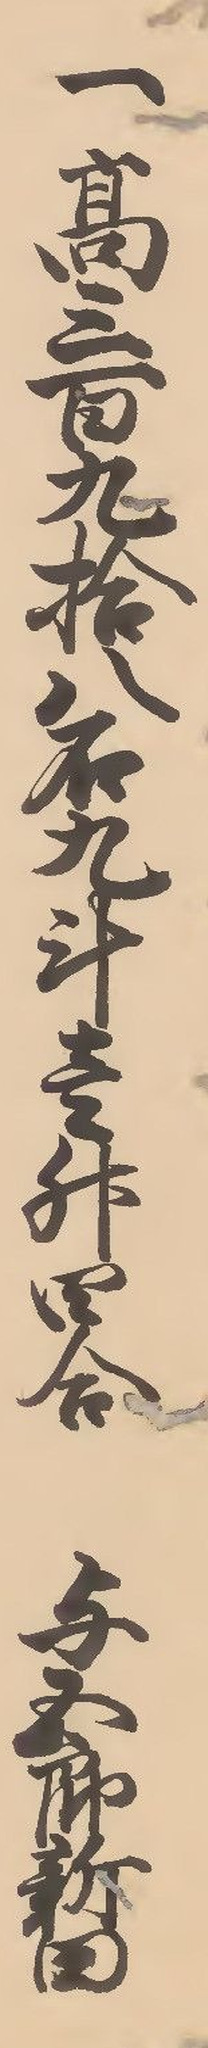一高三百九拾八石九斗壱升四合与五郎新田
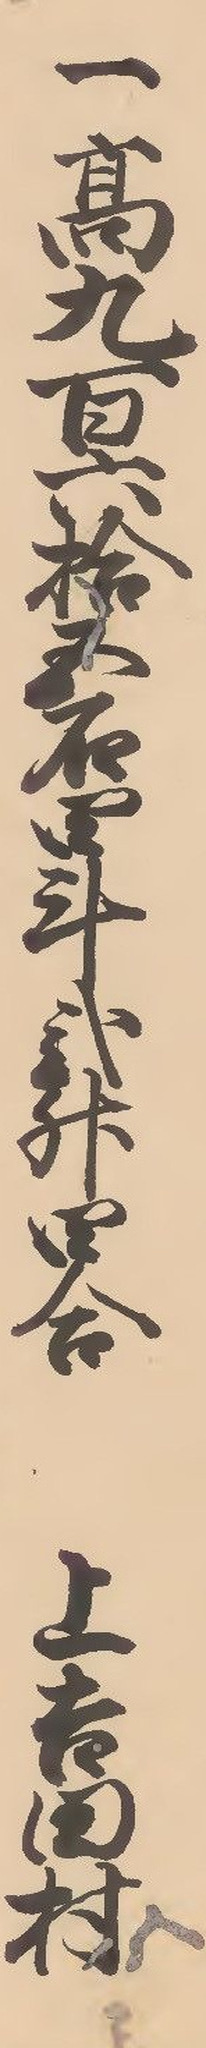一高九百六拾五石四斗弐升四合上吉田村
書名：遠江国郷帳
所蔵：国立公文書館 National Archives of Japan
